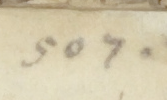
507.
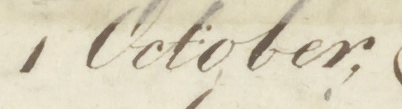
1 October,
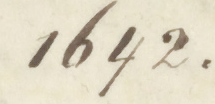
1642.
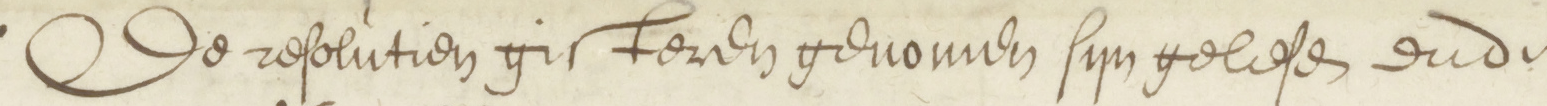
De resolutien gisteren genomen syn gelesen ende
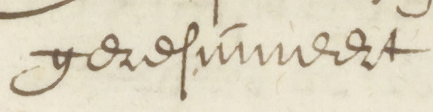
geresumeert
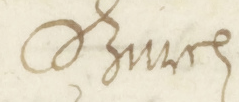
Burch
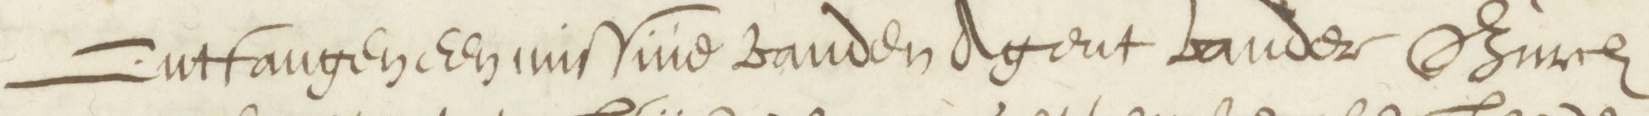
Ontfangen een missiue vanden Agent vander Burch
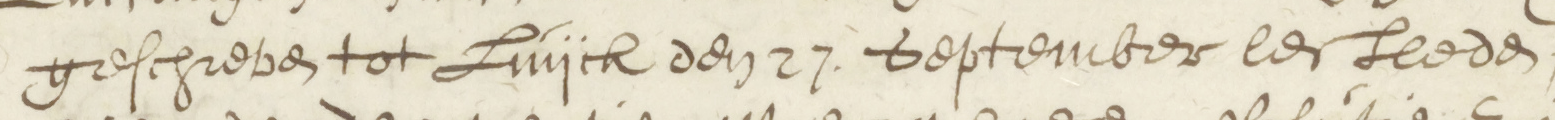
geschreven tot Luijck den 27. September lestleden,
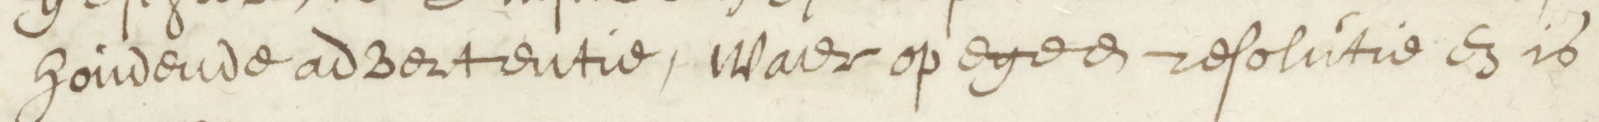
houdende advertentie, Waer op egeen resolutie en is
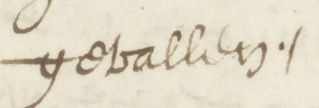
gevallen.
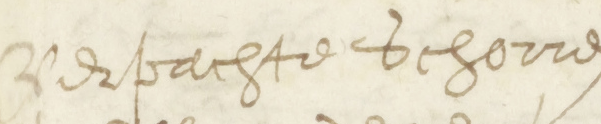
Verpachte Schorren
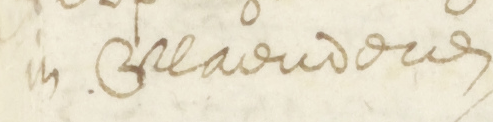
in Vlaenderen.
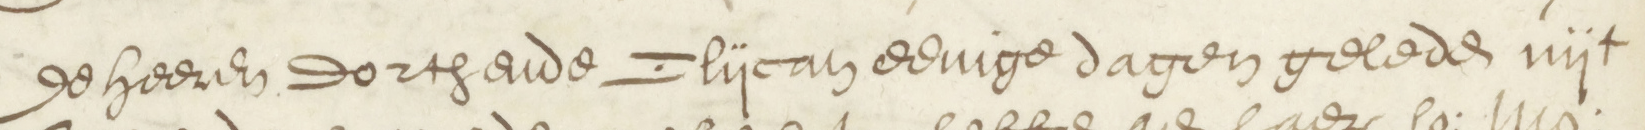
De heeren Dorth ende Olijcan eenige dagen geleden uijt
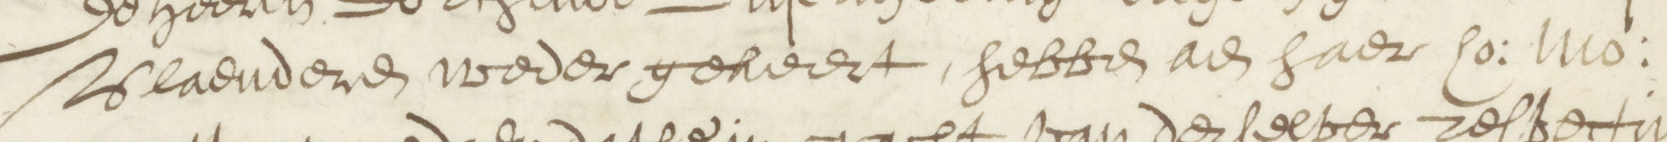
Vlaenderen weder gekeert, hebben aen haer ho:Mo:
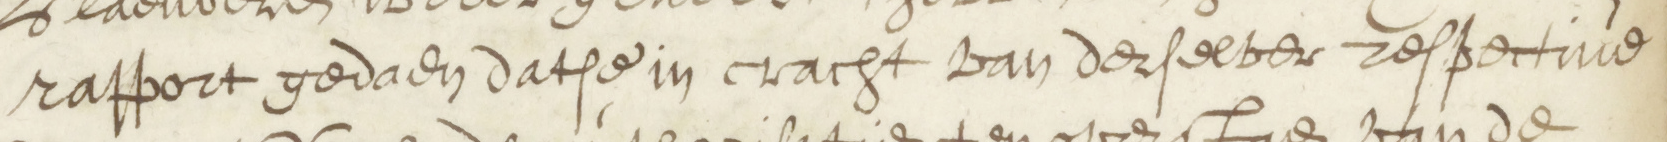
rapport gedaen datse in cracht van derselver respectiue
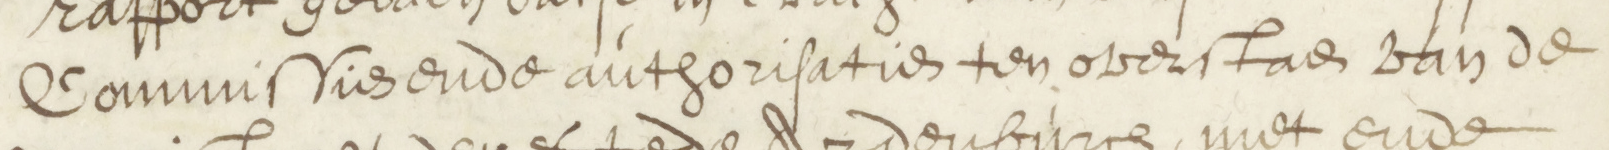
Commissien ende authorisatien ten overstaen van de
